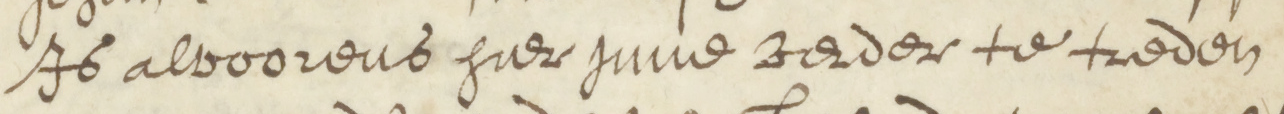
Is alvoorens hier inne verder te treden
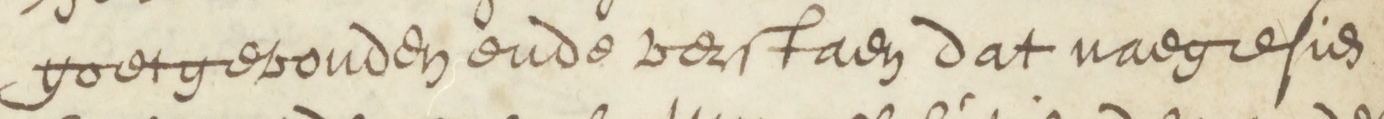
goetgevonden ende verstaen dat naegesien
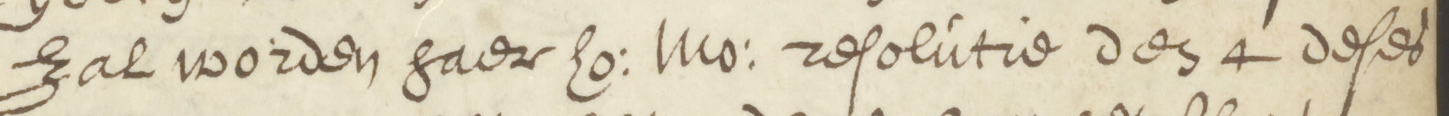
zal worden haer ho:Mo: resolutie den 4 deses
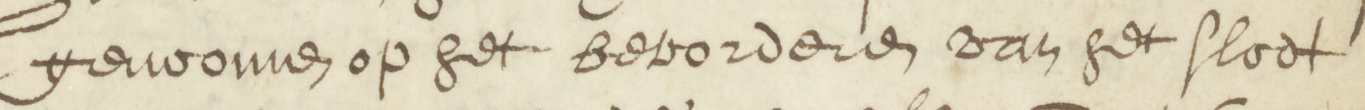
genoomen op het bevorderen van het slodt
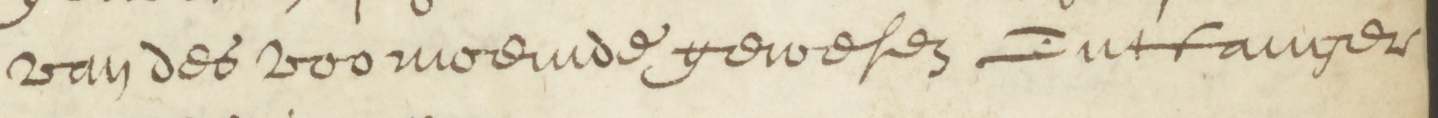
van des voornoemde gewesen Ontfanger
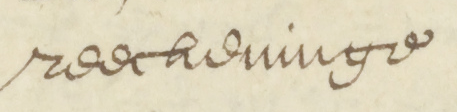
reeckeninge
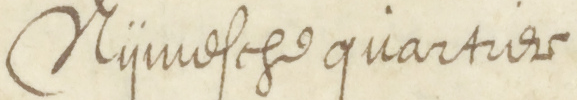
Nijmesche quartier
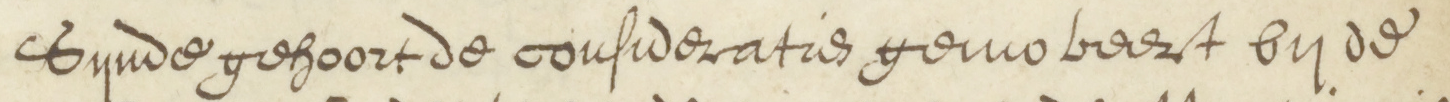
Synde gehoort de consideratien gemoveert by de
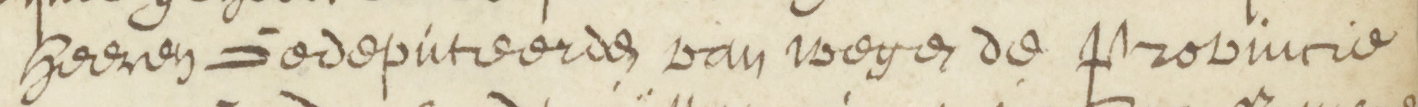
heeren Gedeputeerden van wegen de Provincie
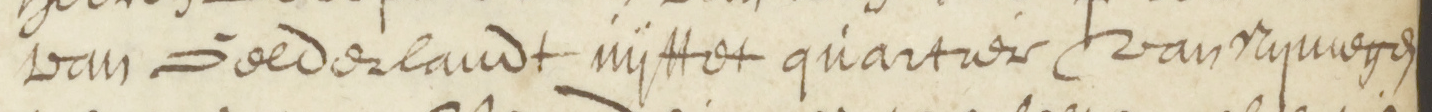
van Gelderlandt uijttet quartier van Nymegen
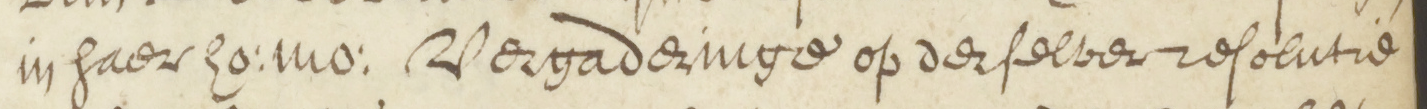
in haer ho:mo: Vergaderinge op derselver resolutie
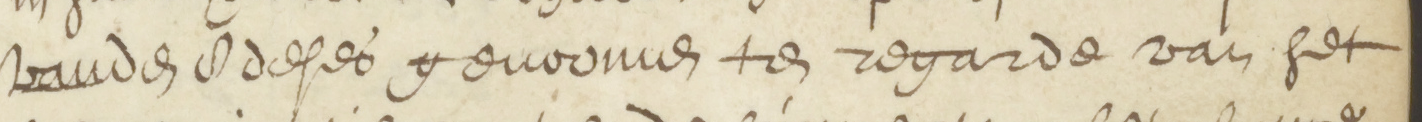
vanden 8 deses genoomen ten regarde van het
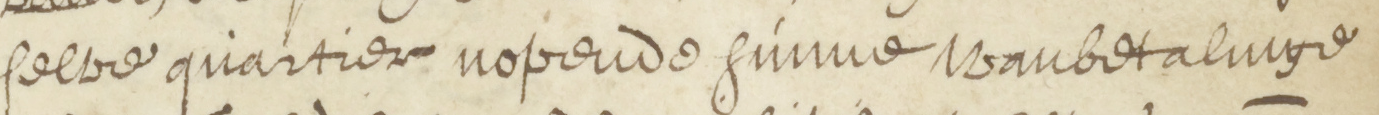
selve quartier nopende hunne wanbetalinge
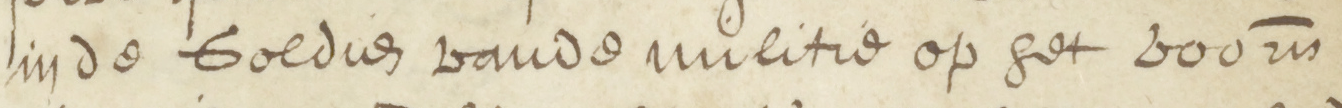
in de Soldien vande militie op het voorn
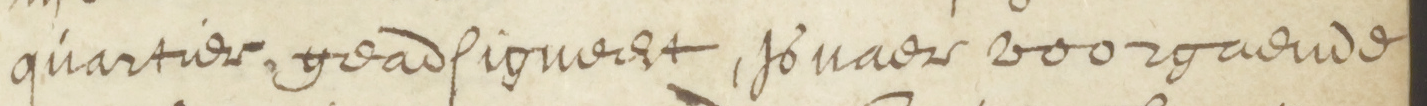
quartier, geadsigneert, Is naer voorgaende
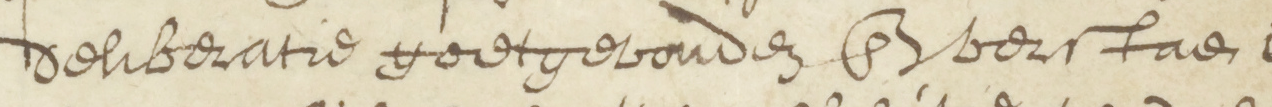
deliberatie goetgevonden & verstaen in
